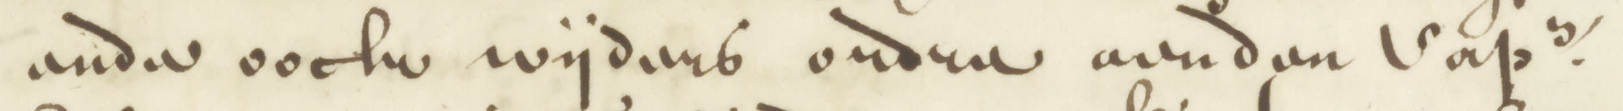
ende oock wijders ordre aen den Capn
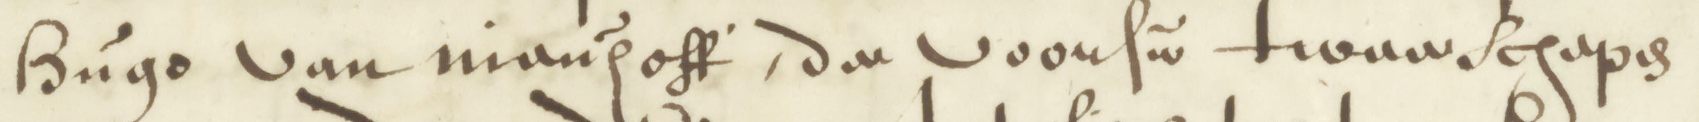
Hugo van Nieuhoff, de voorsr twee schepen
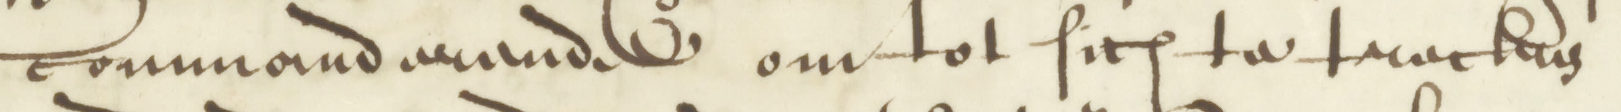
commanderende om tot sich te trecken
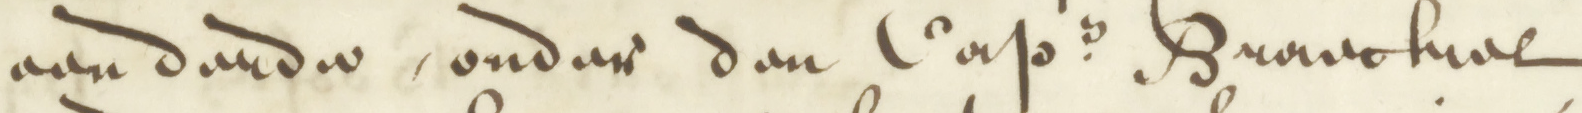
een derde onder den Capn Braeckel
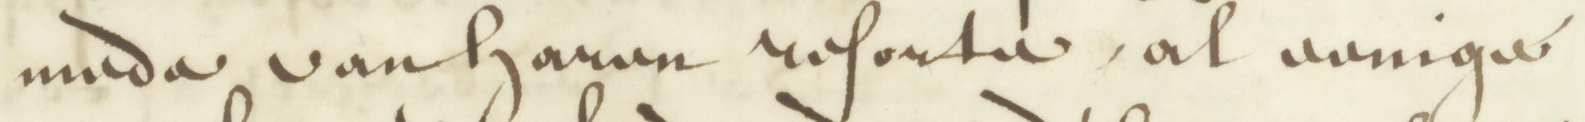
mede van haren resorte, al eenige
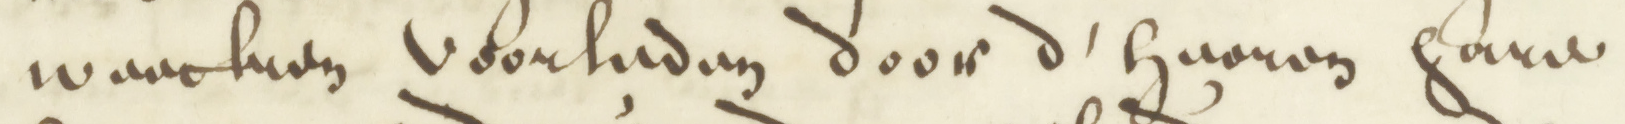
weecken voorleden door d'heeren hare
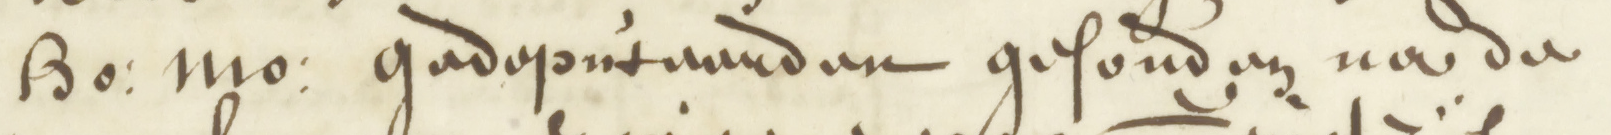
Ho: Mo: gedeputeerden gesonden na de
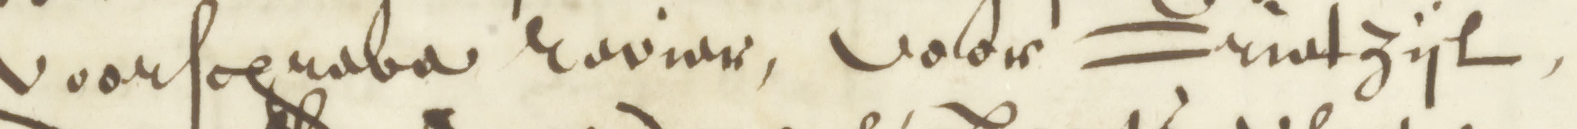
voorschreve revier, voor Grietzijl
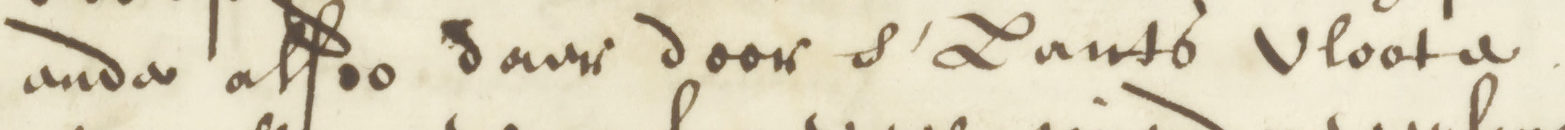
ende alsoo daer door s'Lants vloote
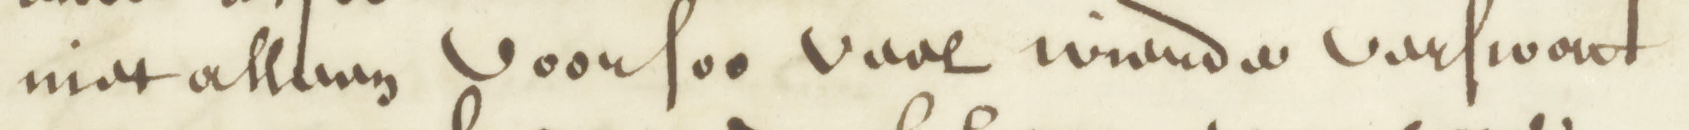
niet alleen voor soo veel wierde verswact
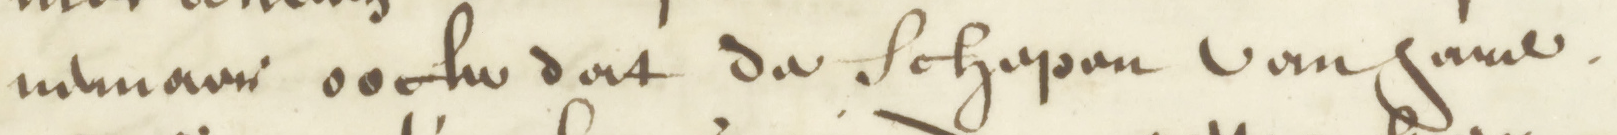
nemaer oock dat de schepen van hare
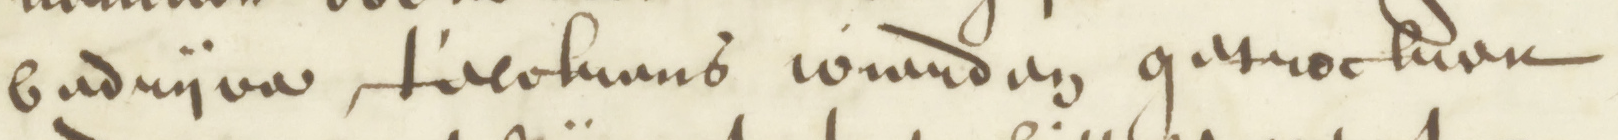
bedrijve telckens wierden getrocken,
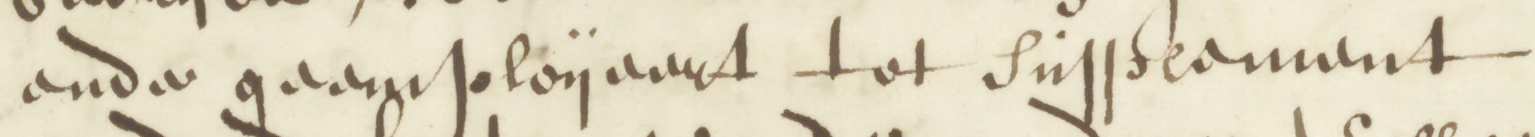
ende geemploijeert tot supplement
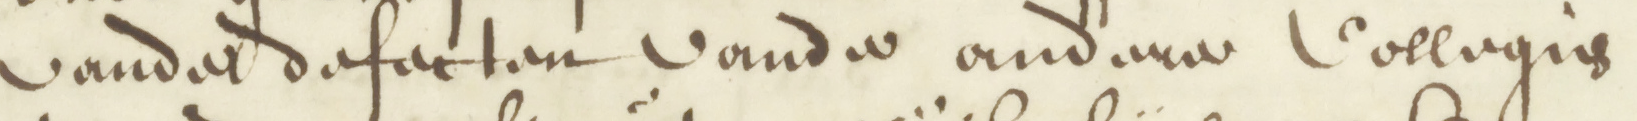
vande defecten vande andere Collegien
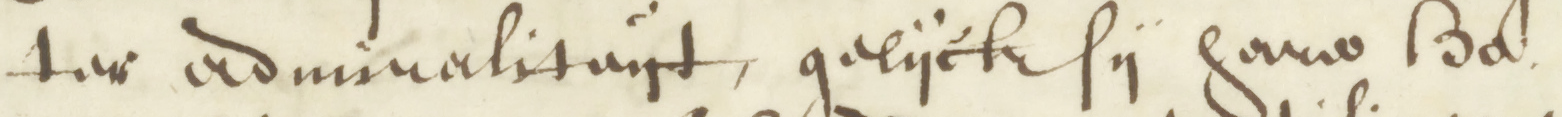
ter Admiraliteijt, gelijck sij hare Ho:
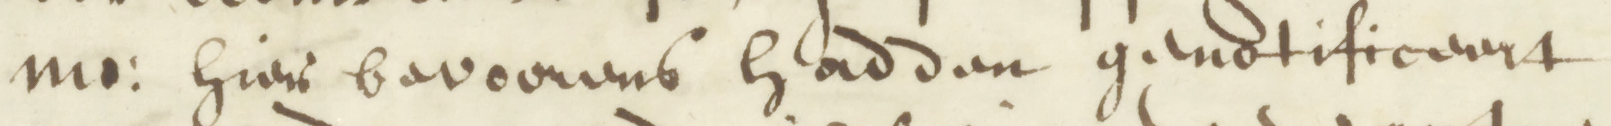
Mo: hier bevoorens hadden genotificeert
